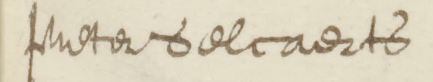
Pieter Selcaerts
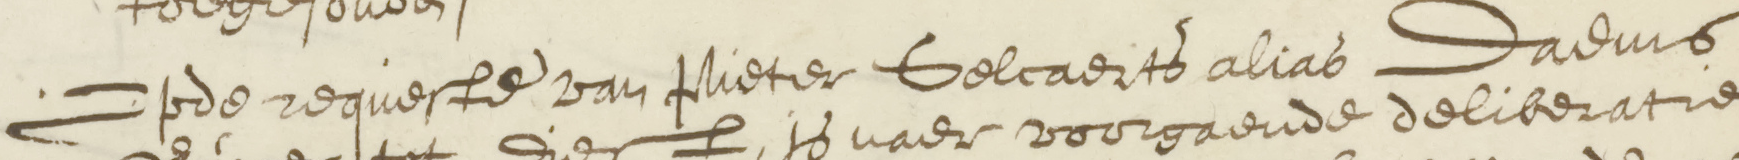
Opde requeste van Pieter Selcaerts alias Daems
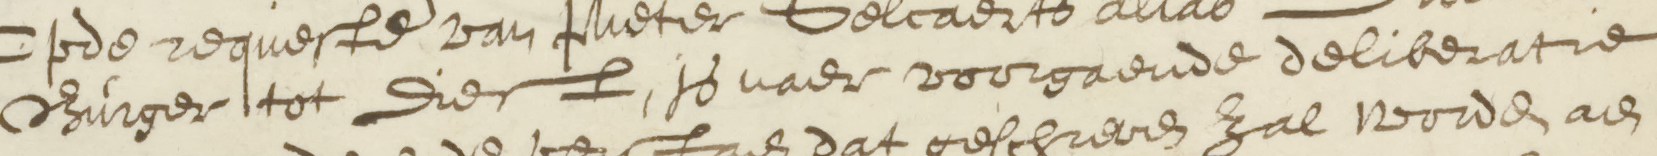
Burger tot Diest, Is naer voorgaende deliberatie
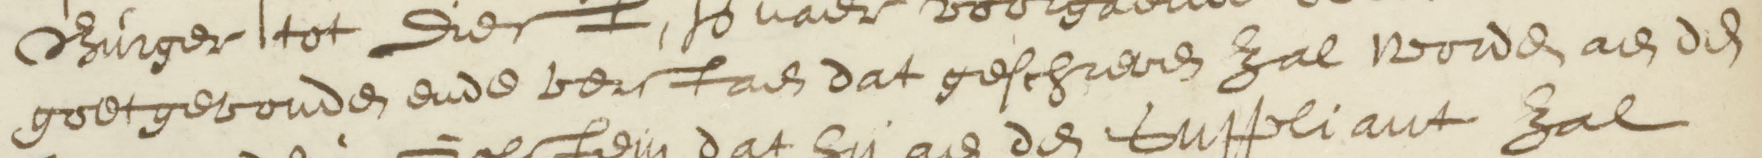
goetgevonden ende verstaen dat geschreven zal worden aen den
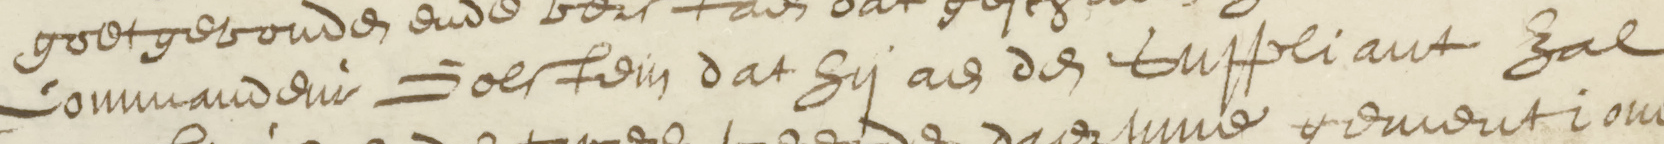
Commandeur Golstein dat hij aen den Suppliant zal
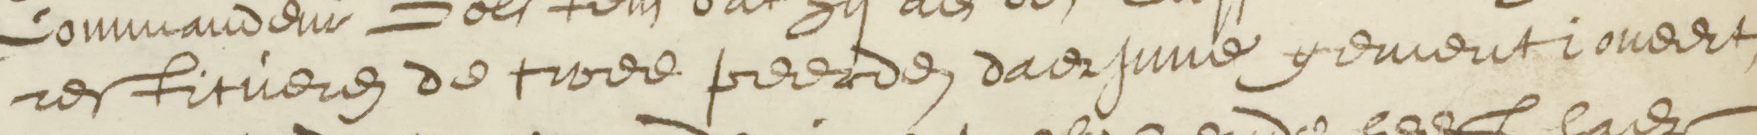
restitueren de twee peerden daerinne gementioneert,
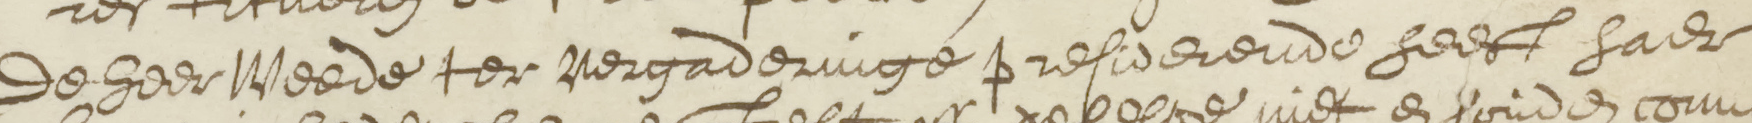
De heer Weede ter Vergaderinge presiderende heeft haer
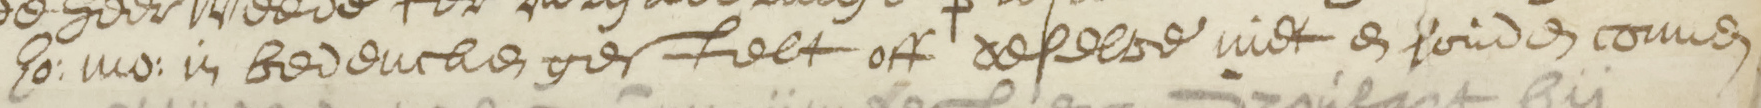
ho:mo: in bedencken gestelt off deselve niet en souden connen
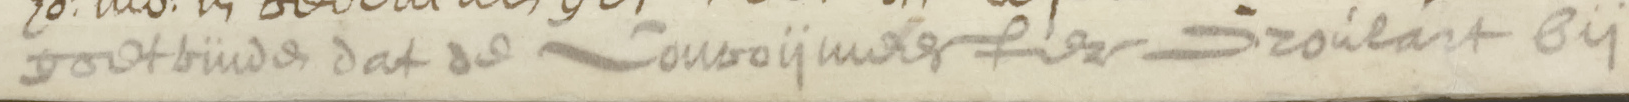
goetvinden dat de Convoijmeester Groulart bij
